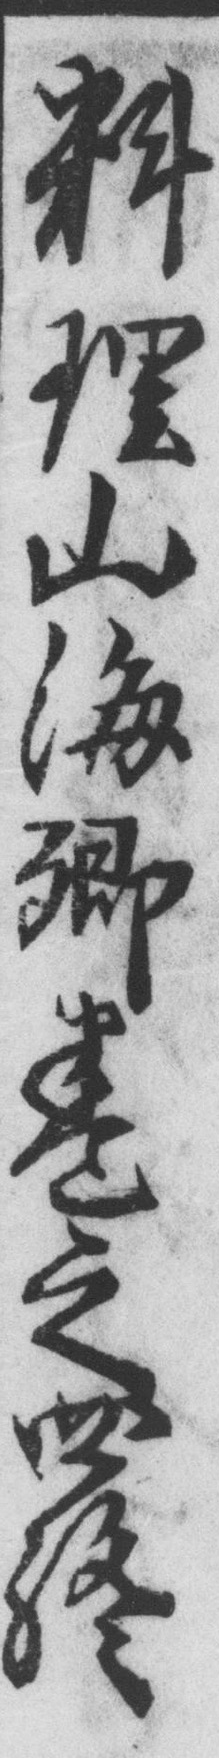料理山海郷巻之四終

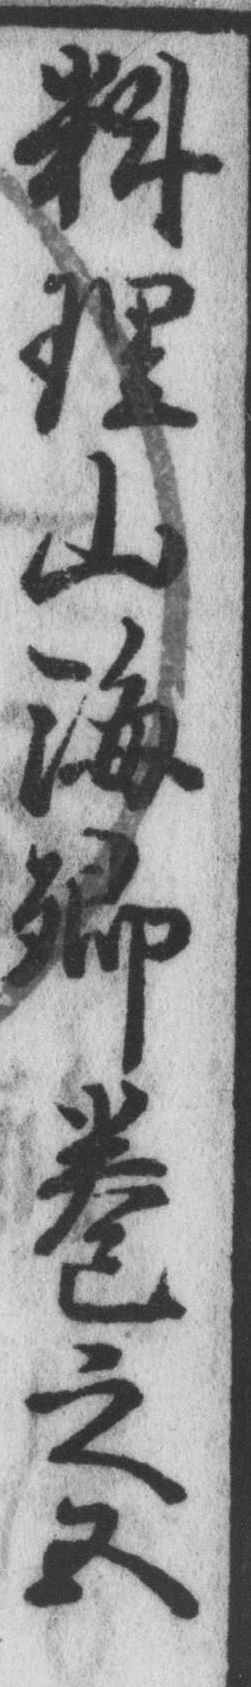料理山海郷巻之五
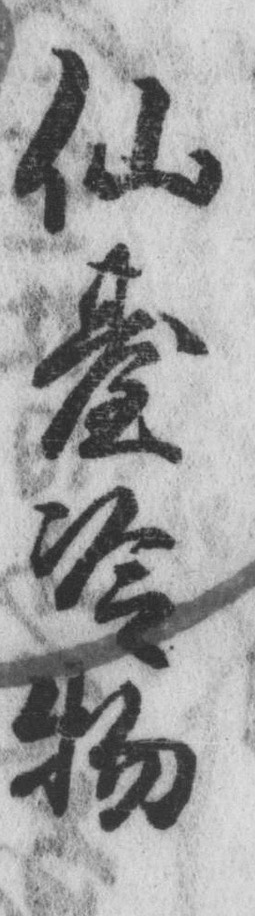仙台冷物
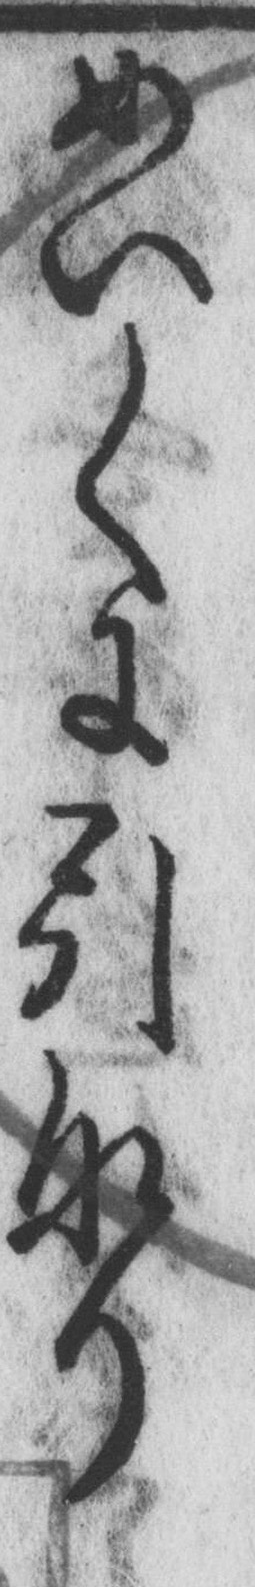めい〳〵に引なり
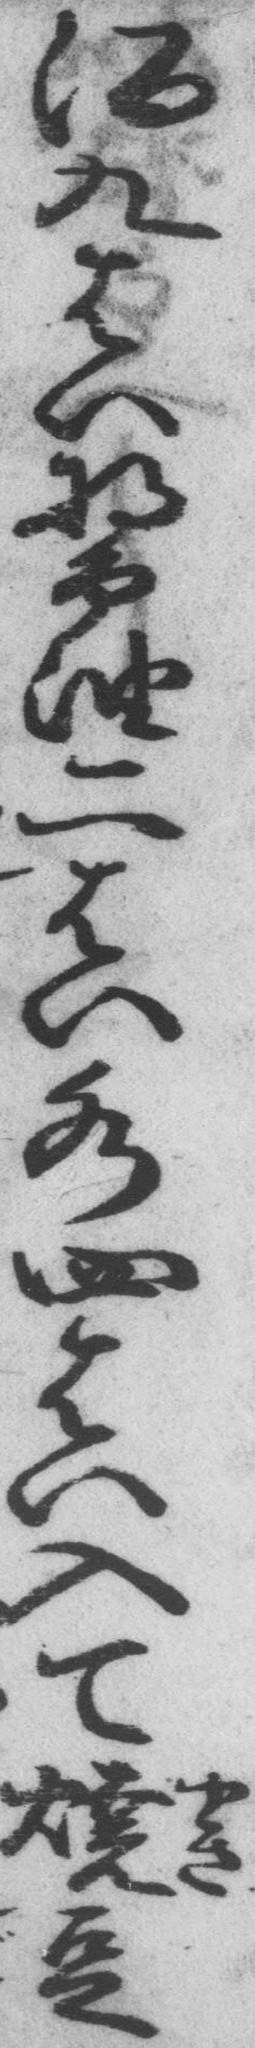酒九はい醤油二はい水四はい入て焼豆
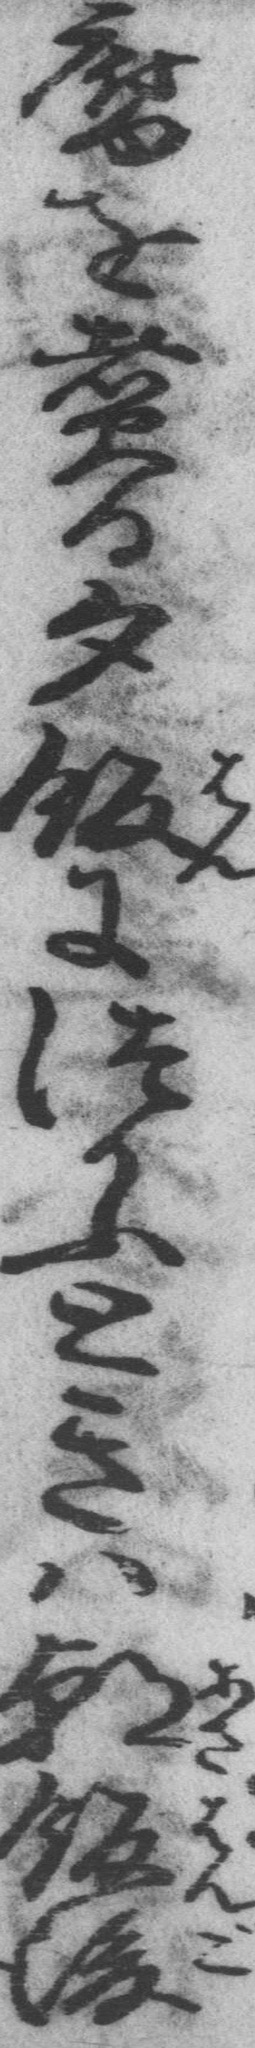腐を煮る夕飯につかふときは朝飯後

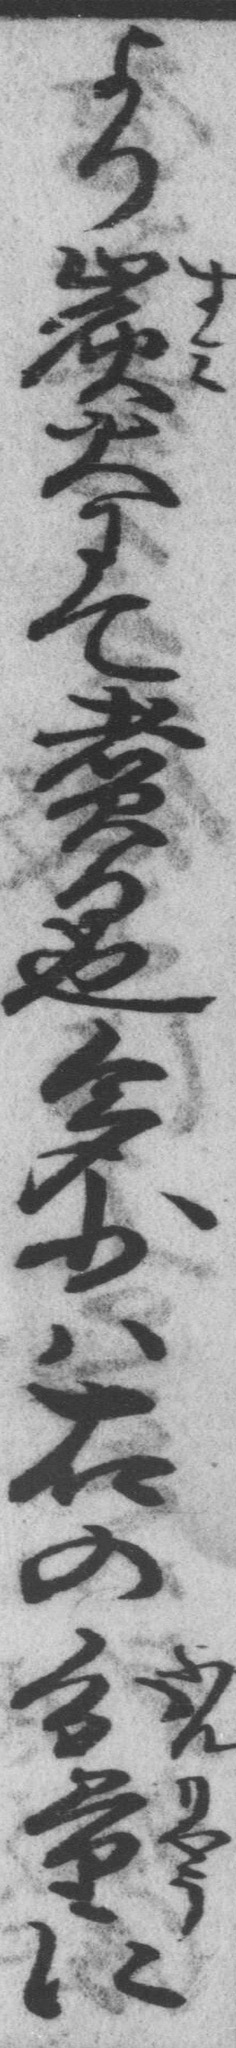より炭火にて煮る也多少は右の分量に
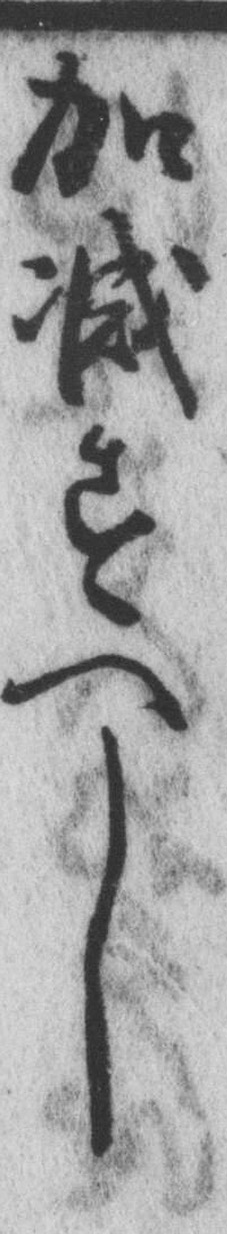加減すへし
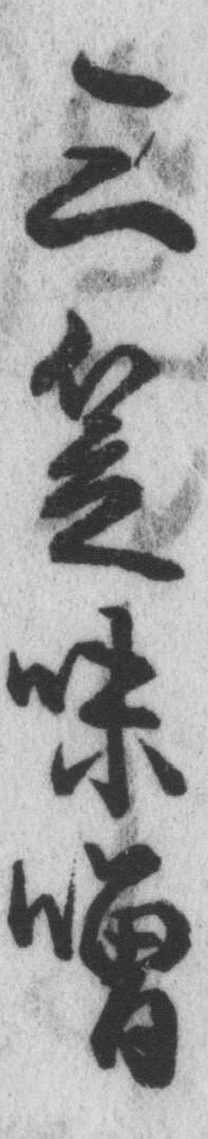三笠味噌
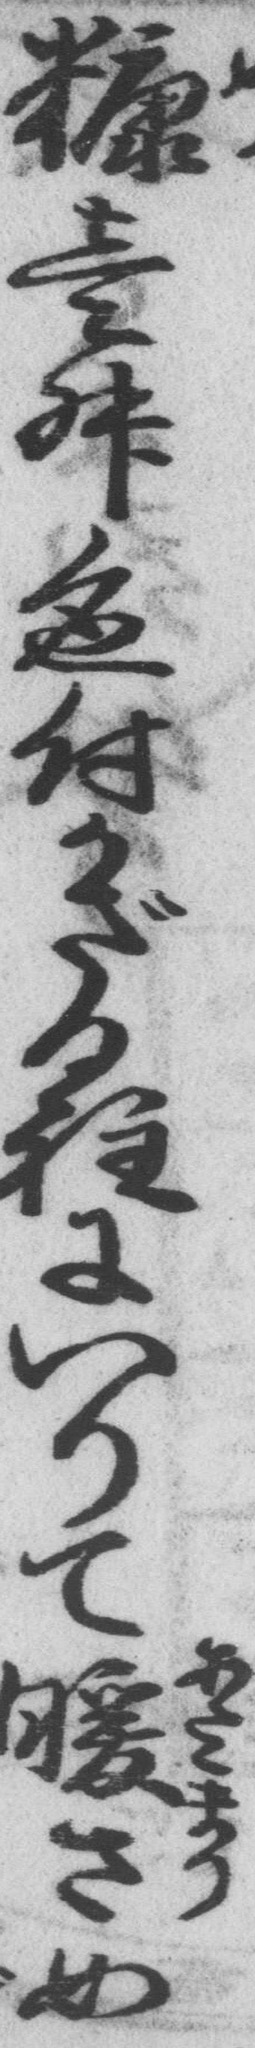糠壱升色付かざる程にいりて暖さめ
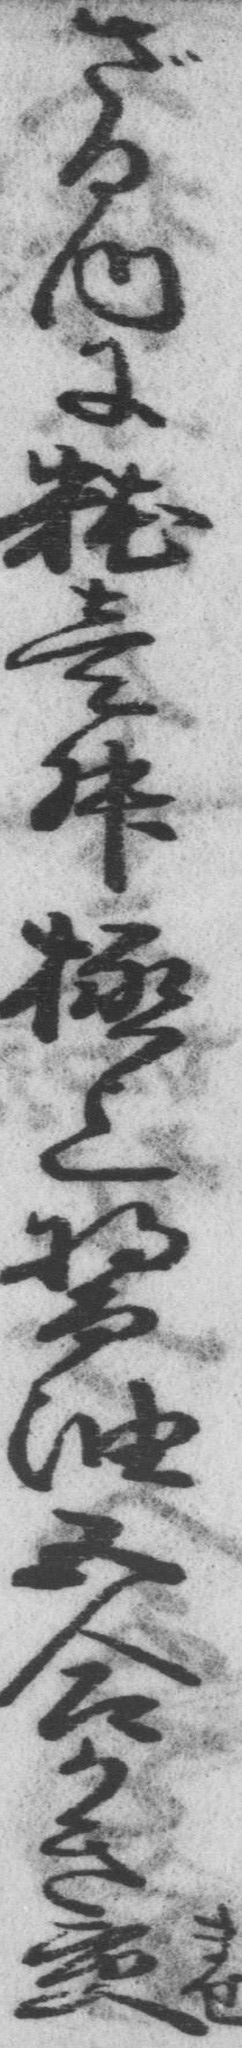ざる内に糀壱升極上醤油五合かき交
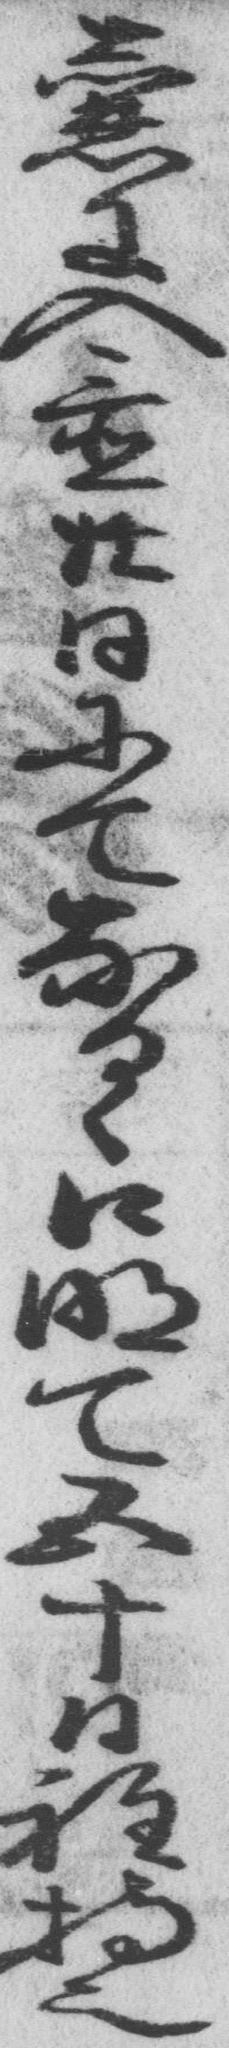壺に入置廿日にてなるゝ口明て五十日程持也
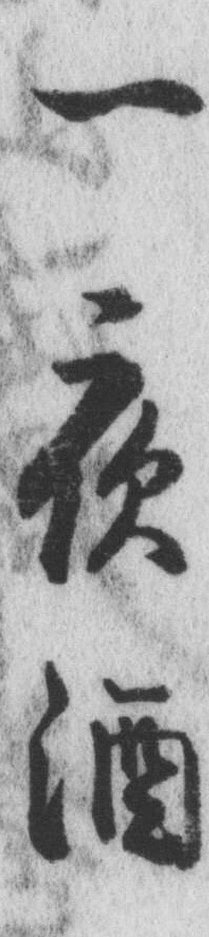一夜酒
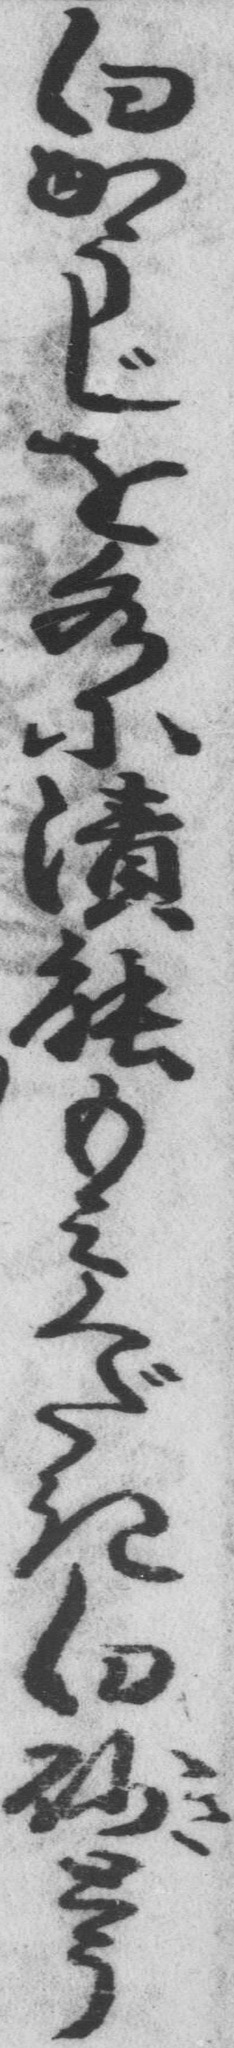白かうじを水に漬能もみくだき白砂とう
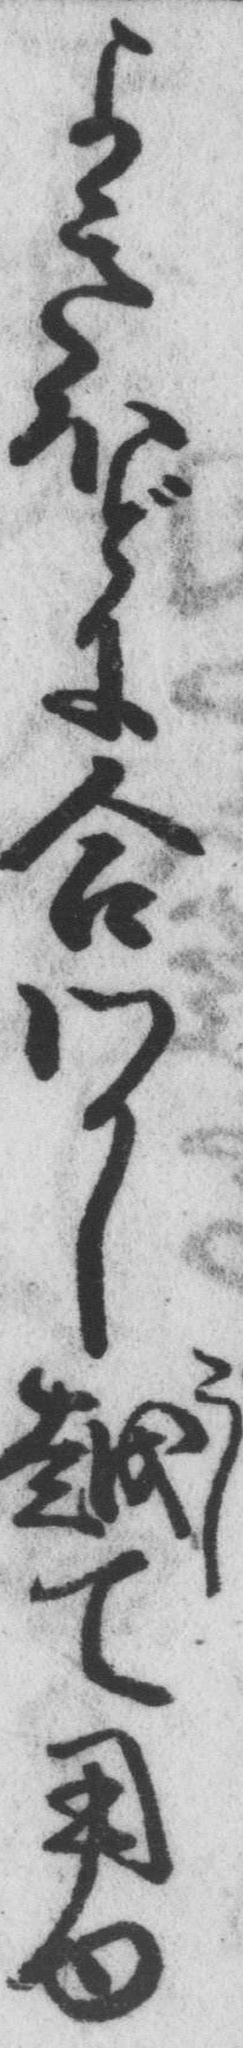よきほどに合わかし越て用ゆ
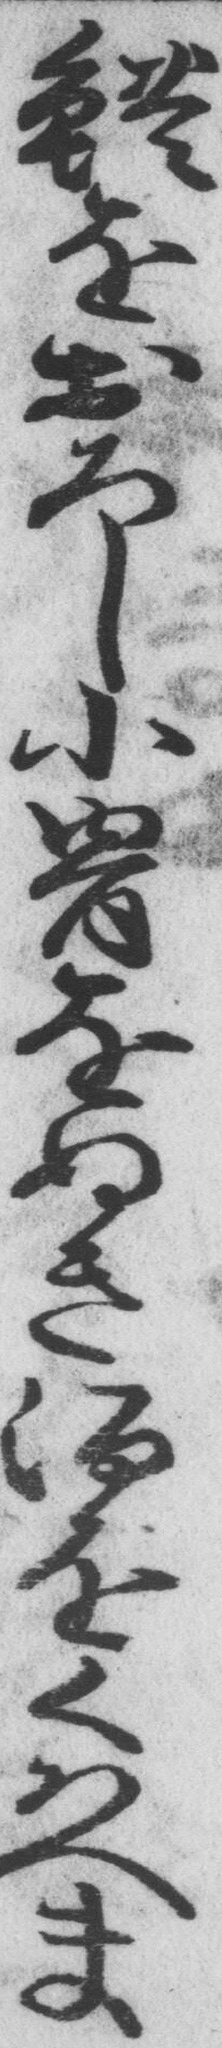鱧をおろし小骨をぬき酒をくはへま
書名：料理山海郷
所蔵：大阪府立大学学術情報センター 国文学研究資料館
